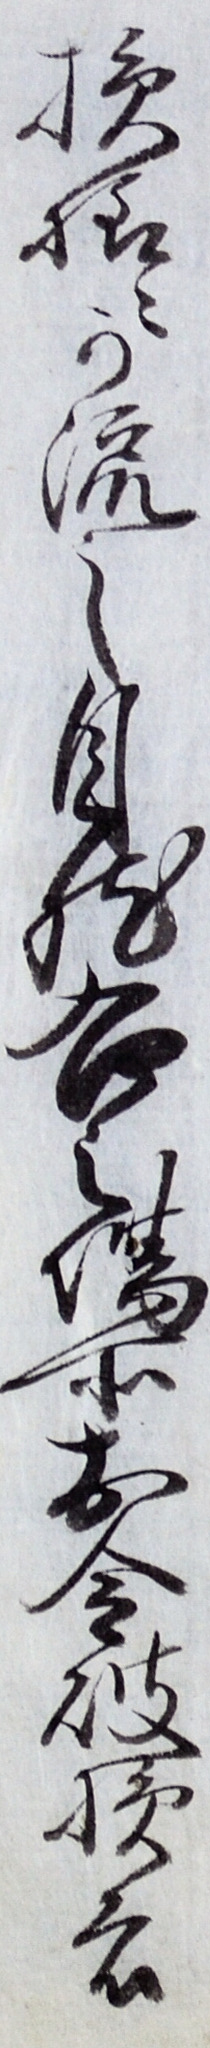損様ニ可流之自然右之場所於令破損者
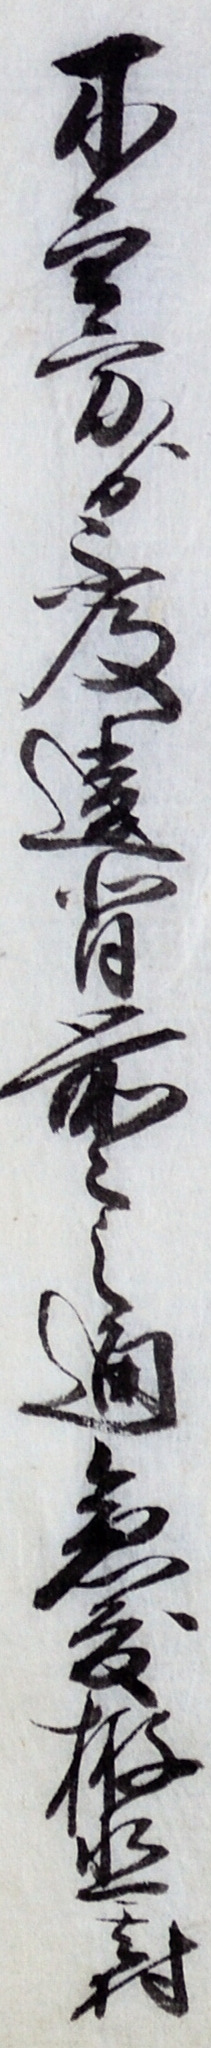木主方ゟ不及違背前々之通急度拵直其村

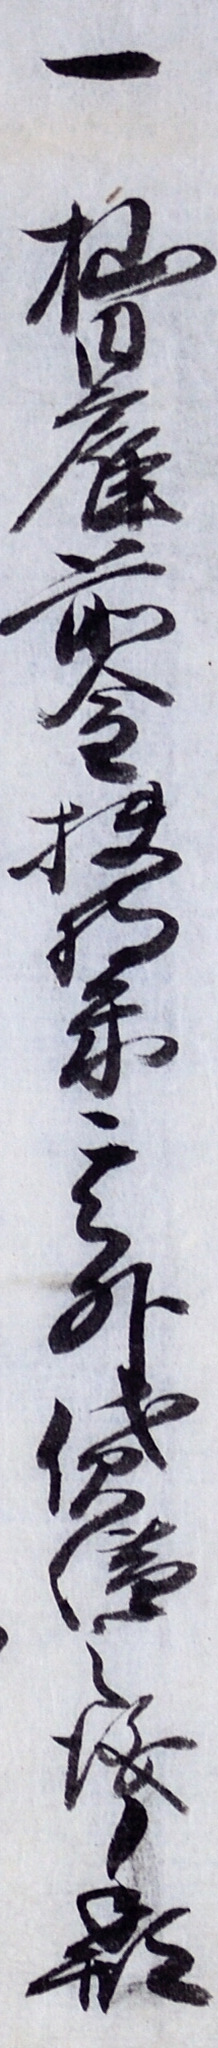一杣日雇前金扶持米其外貸借之儀手形
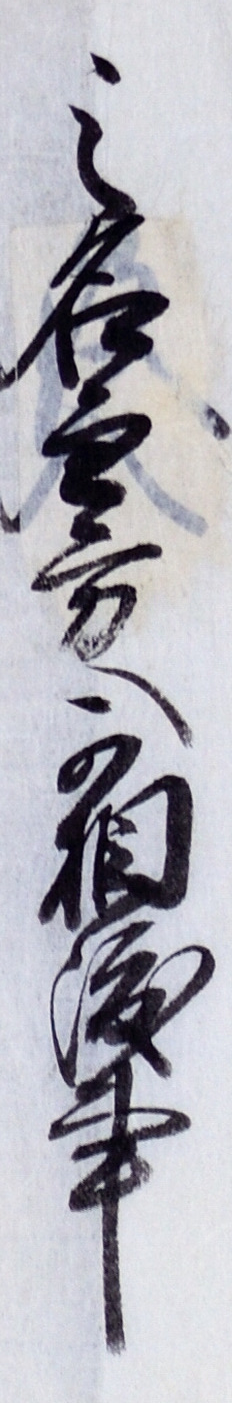之名主方へ可相渡事
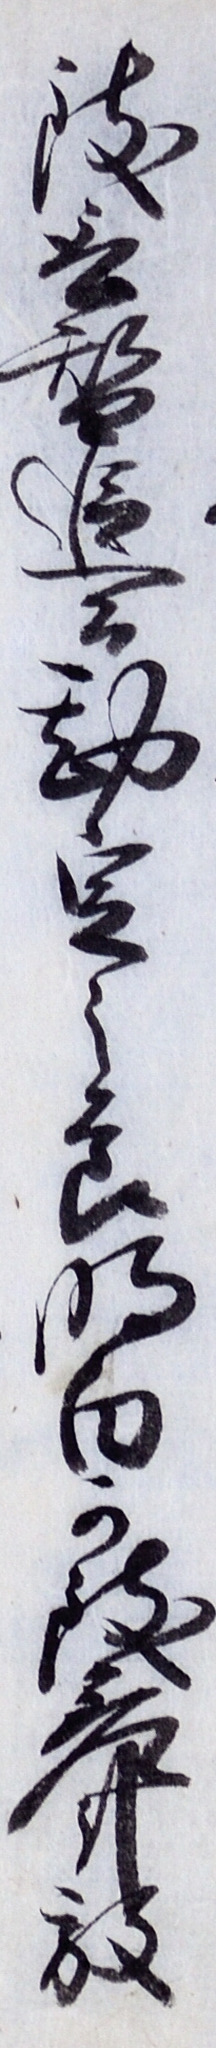致取替追而勘定之節明白可致差引放
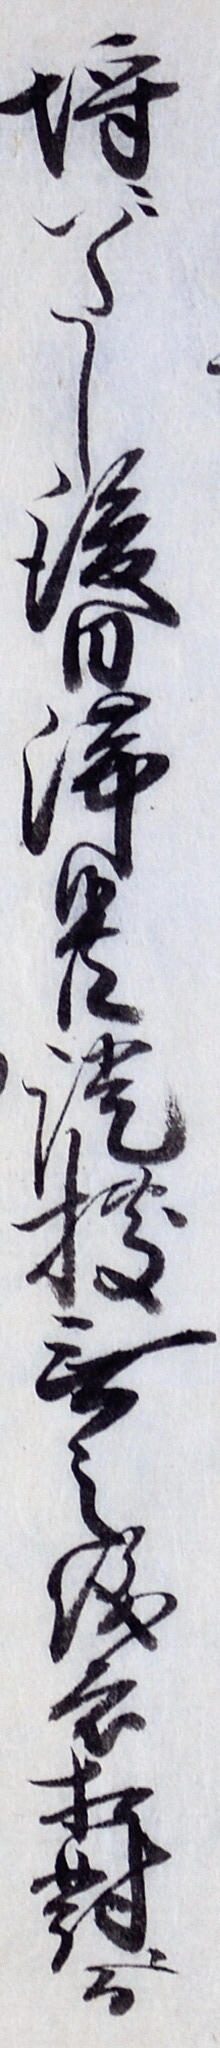埒ニいたし後日滞候共証拠無之儀者相対ニ而
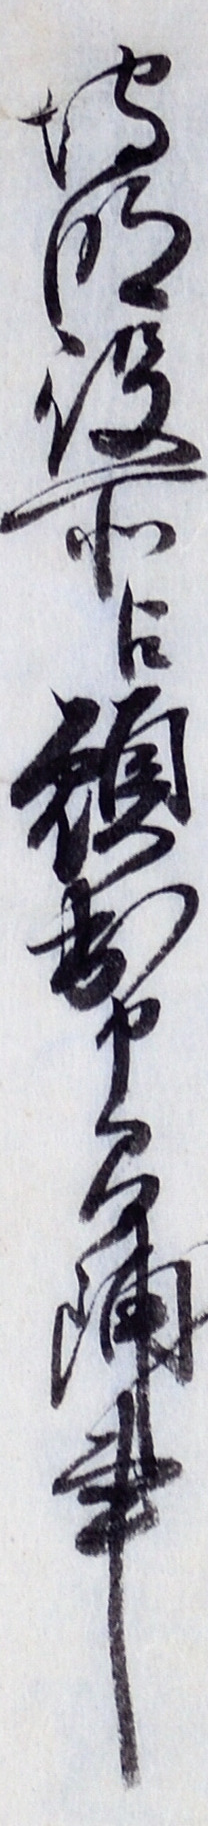埒明役所江願出申間鋪事
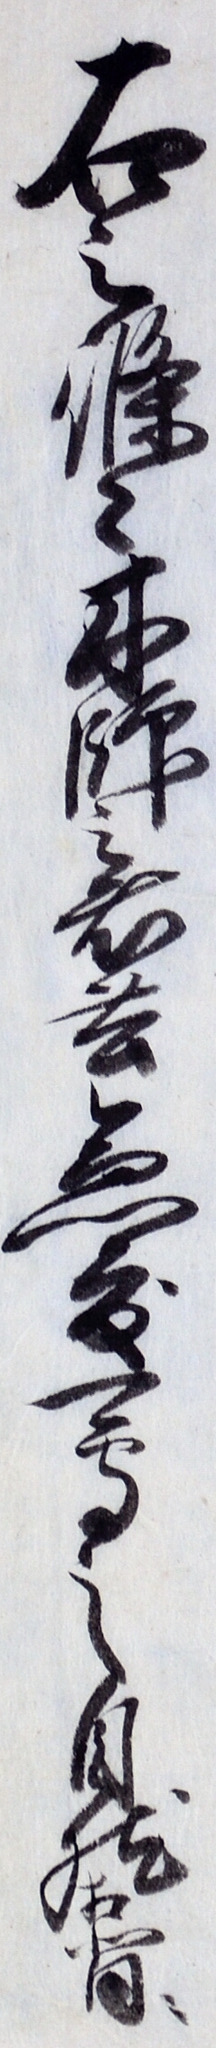右之条々木師之者共急度可守之自然相背ニ
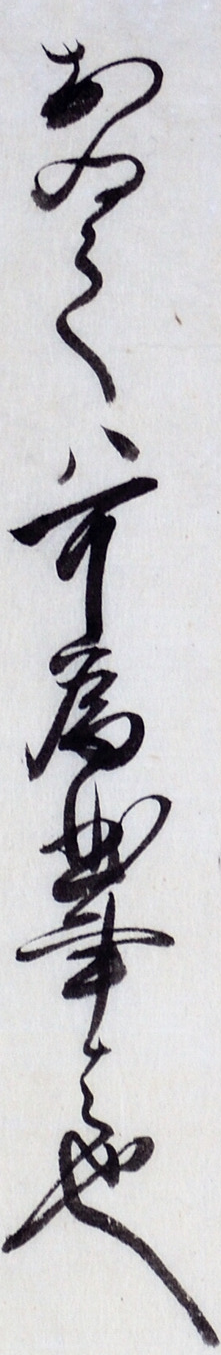おゐてハ可為曲事者也
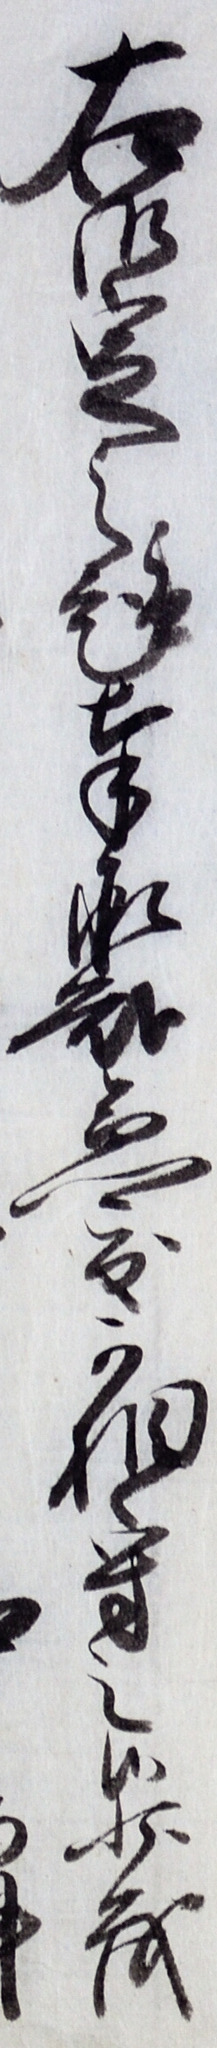右御定之趣奉承知急度可相守之候少も
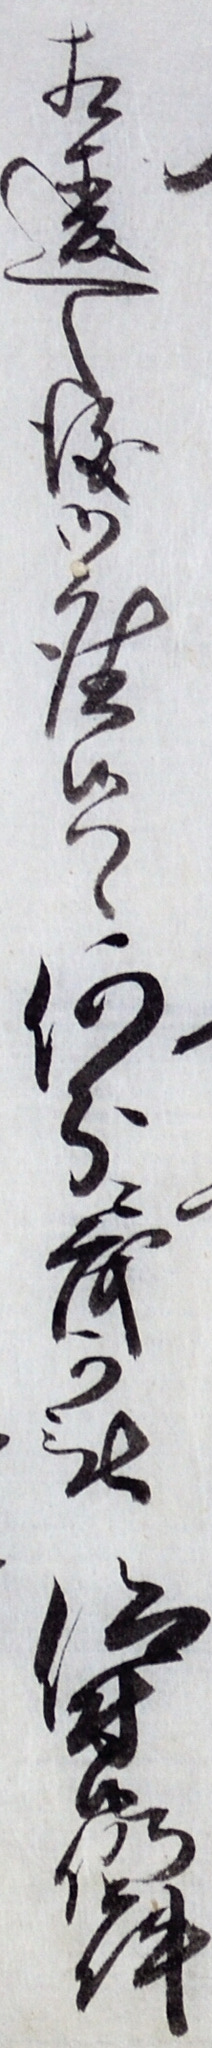相違之儀御座候ハヽ何分ニも可被仰付候仍如件
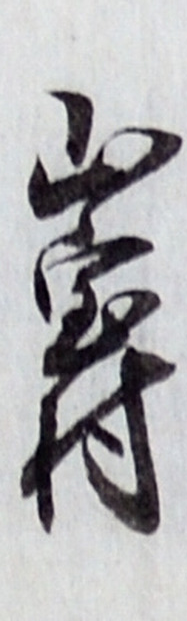山室村

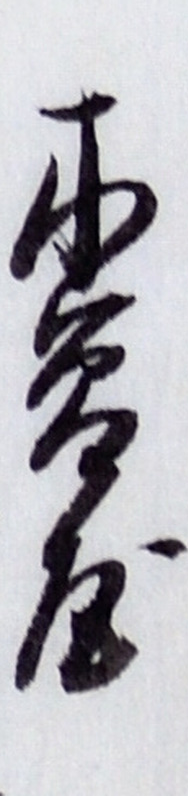木曽屋
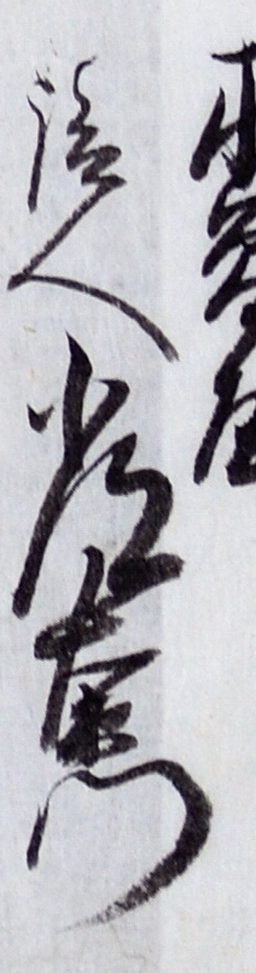請人常右衛門
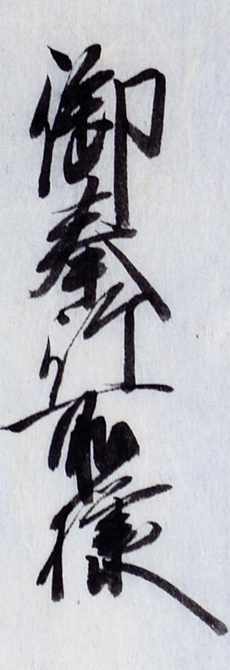御奉行所様
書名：御持山御払掟書願書控
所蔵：伊那市立高遠町図書館・合同会社AMANE
